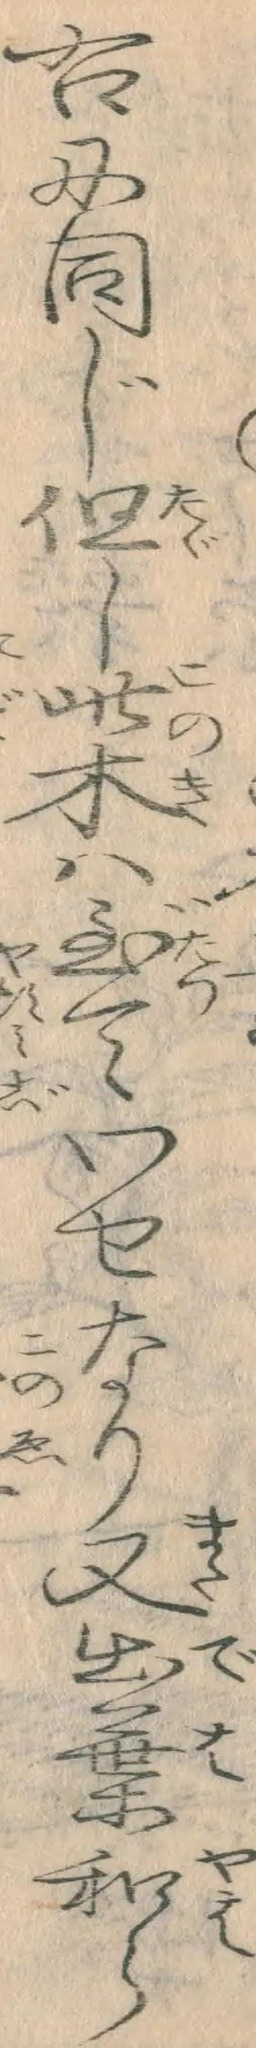右に同じ但し此木は至わせなり又出葉和ら
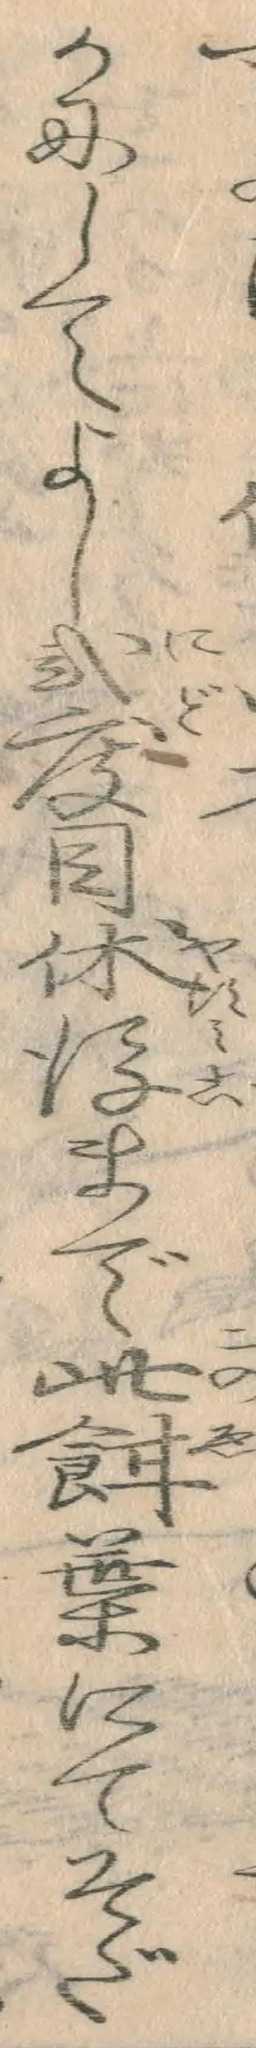かにしてよし弐度目休後まで此餌葉にてそだ
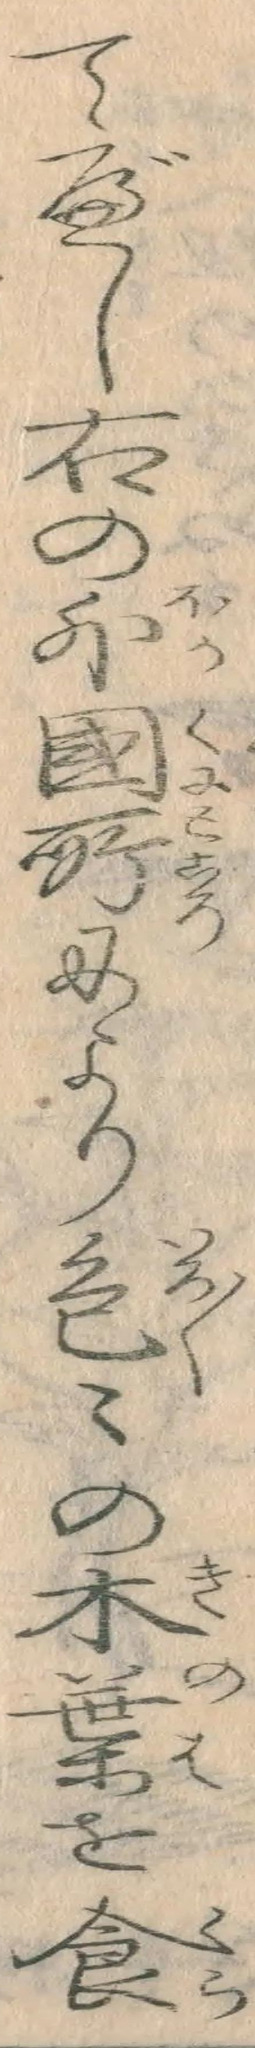てべし右の外国所により色々の木葉を食
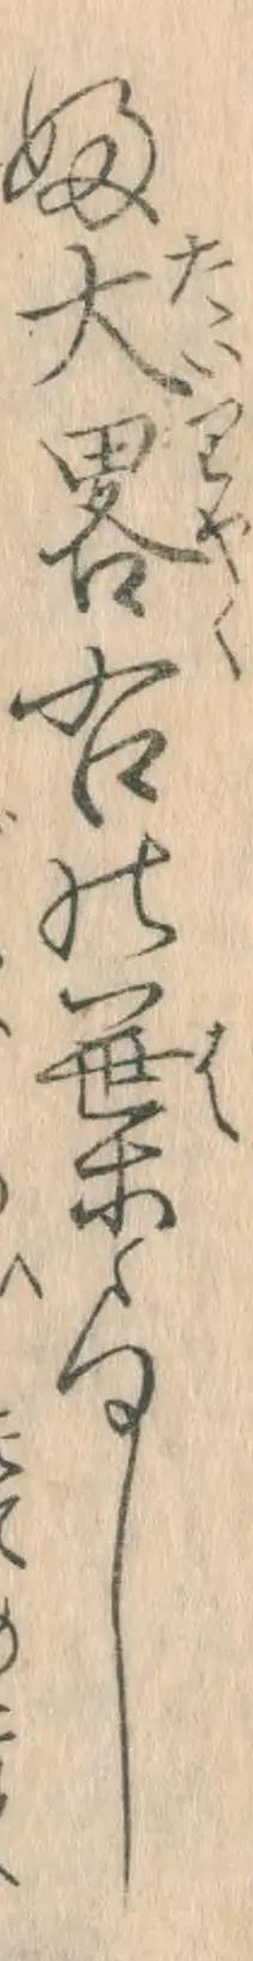ふ大略右の葉よし
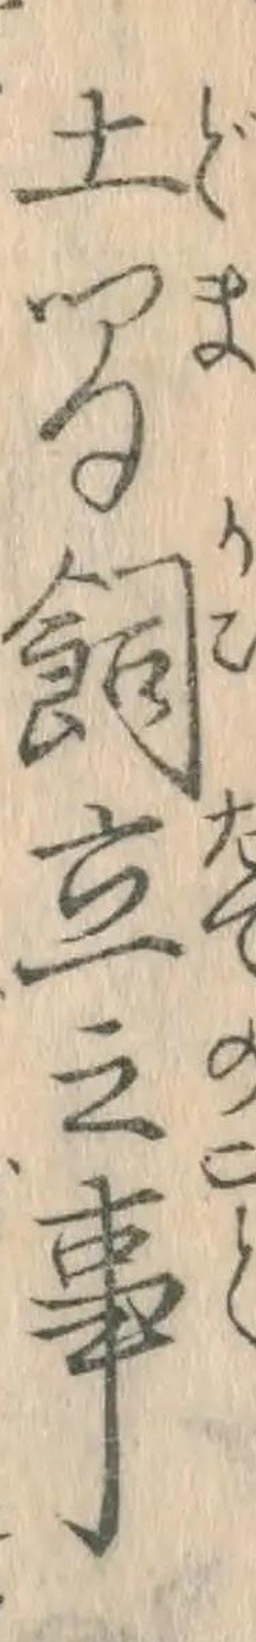土間飼立之事

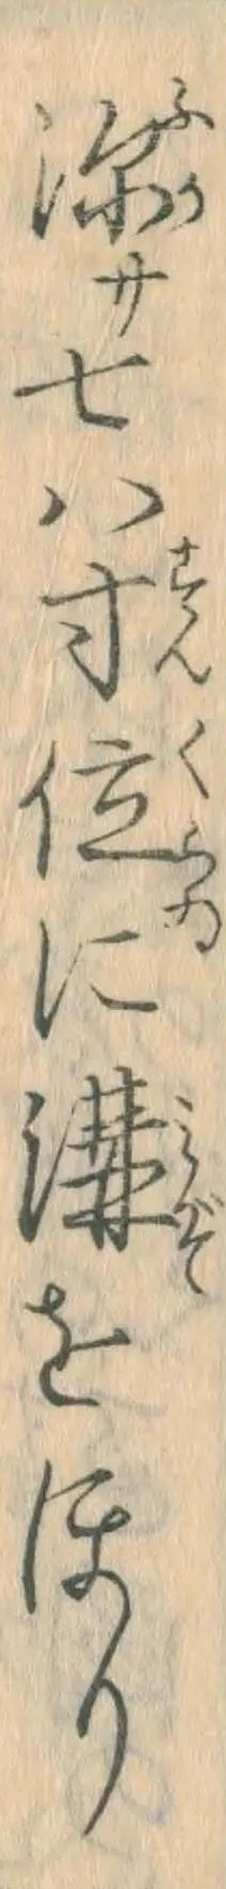深さ七八寸位に溝をほり
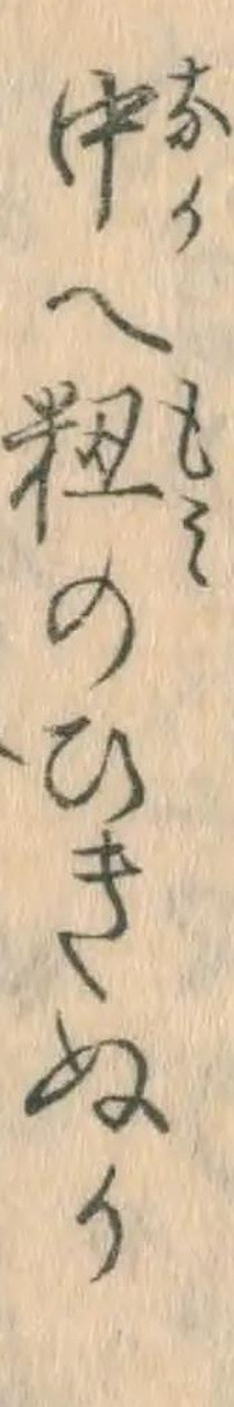中へ籾のひきぬか
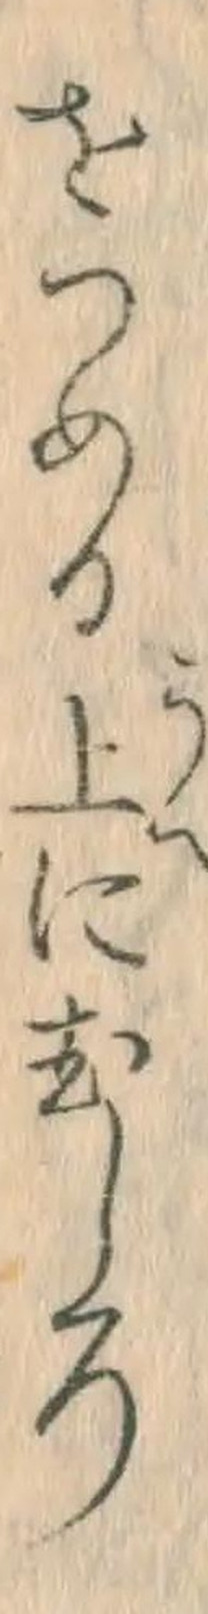をつめる上にむしろ
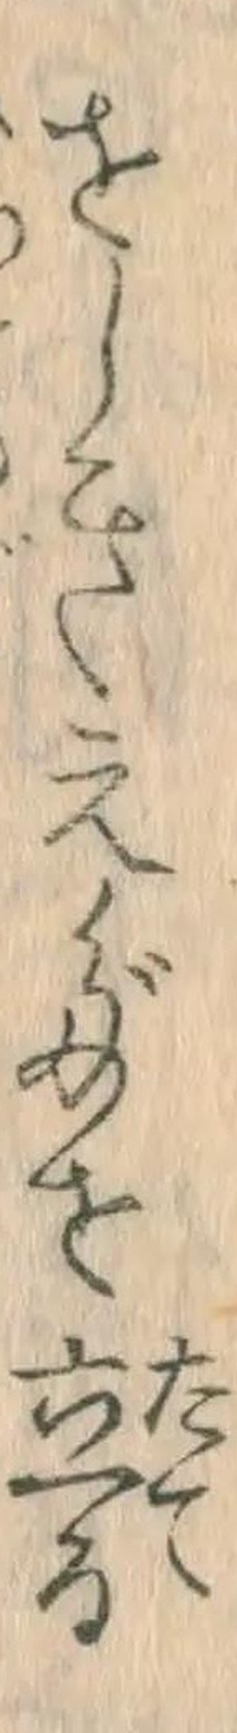をしきえだを立る
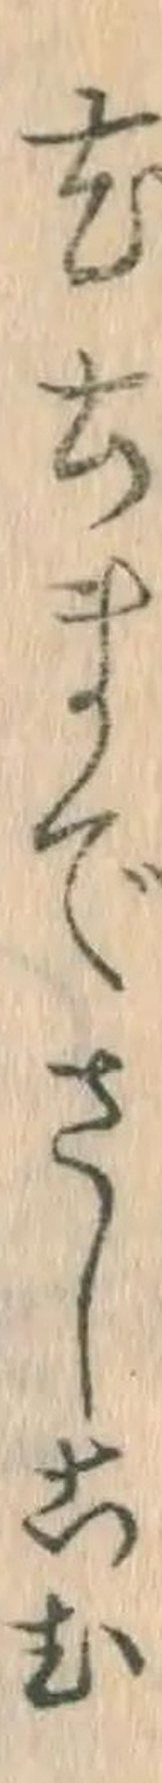尤土までさしこむ
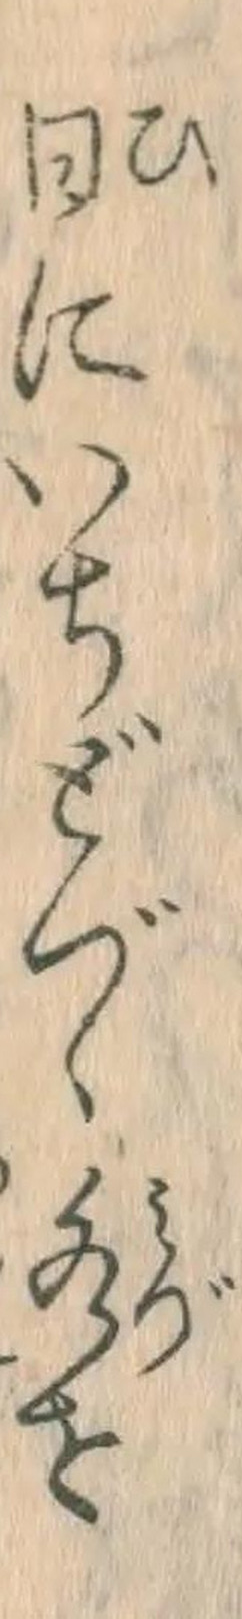日にいちどづゝ水を
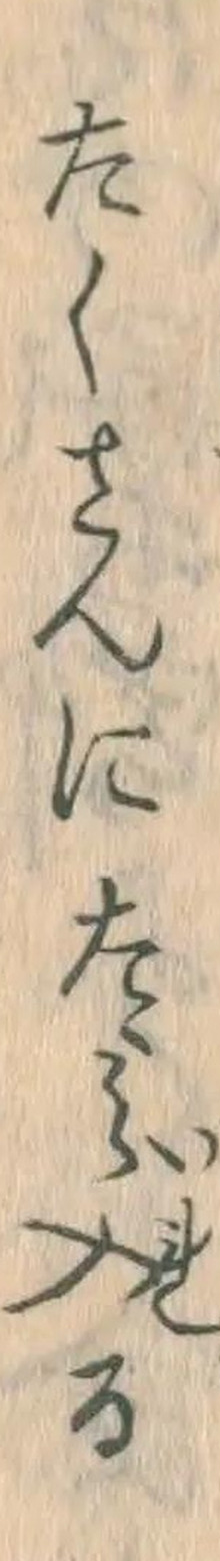たくさんにたゝえ入る
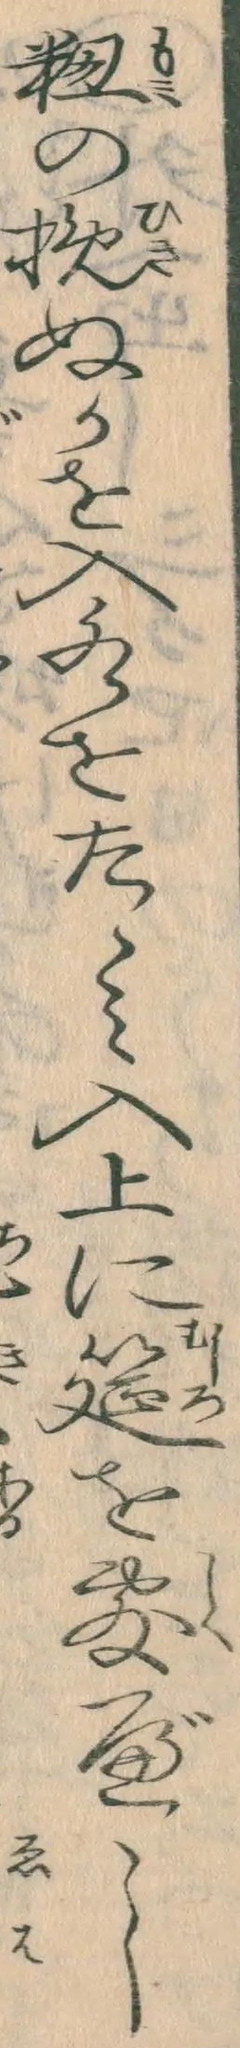籾の挽ぬかを入水をたゝえ入上に筵を敷べし
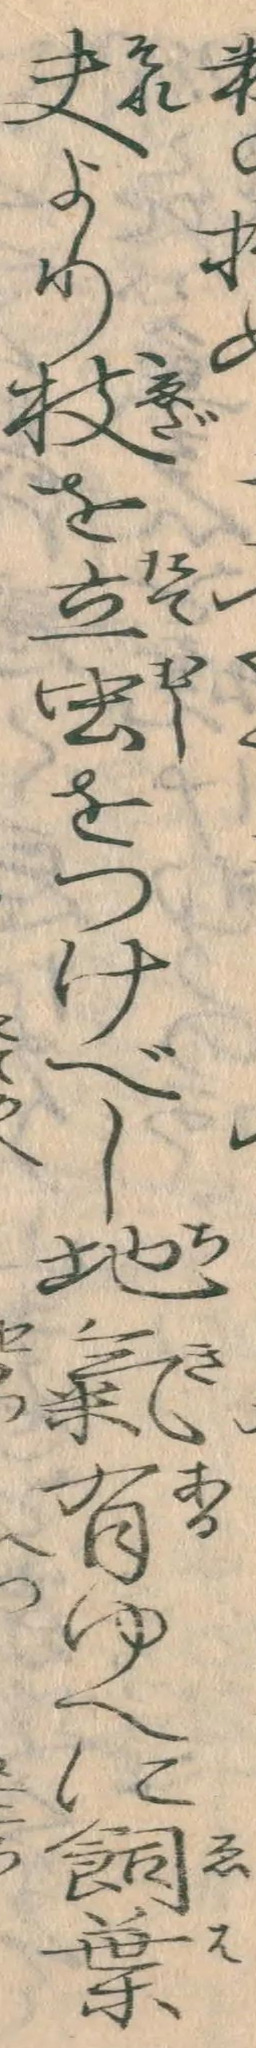夫より枝を立虫をつけべし地気有ゆへに飼葉
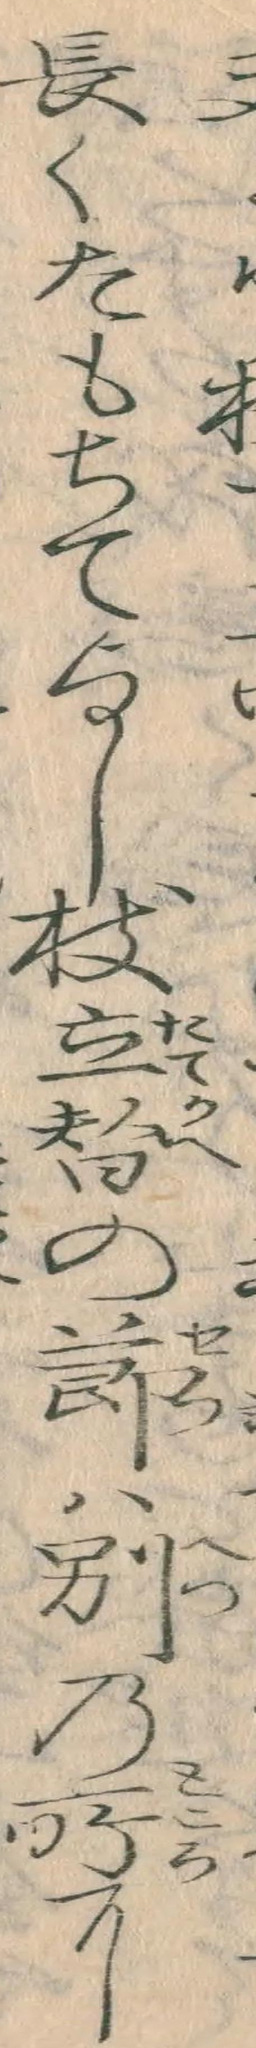長くたもちてよし枝立替の節は別の所に
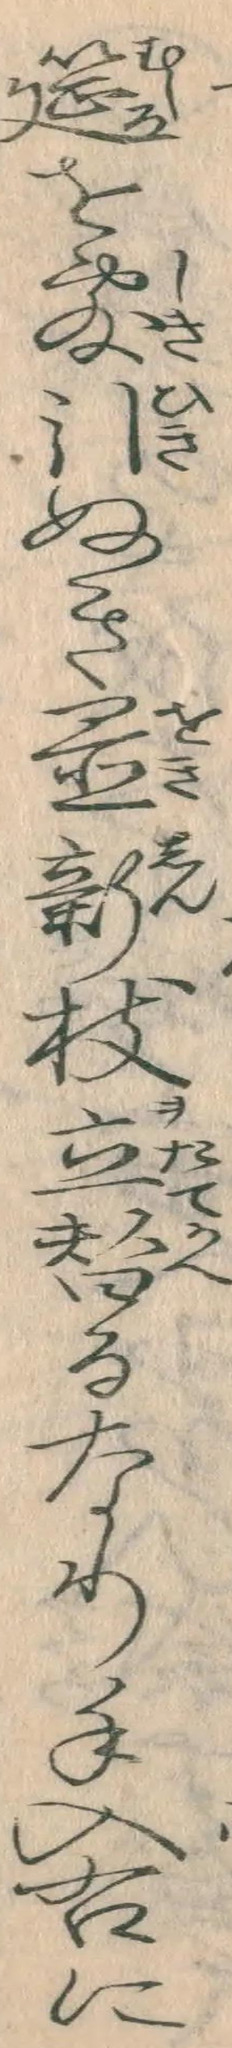筵を敷引ぬき置新枝立替るなり手入右に
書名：山繭養法秘傳抄
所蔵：国立国会図書館 National Diet Library, JAPAN
